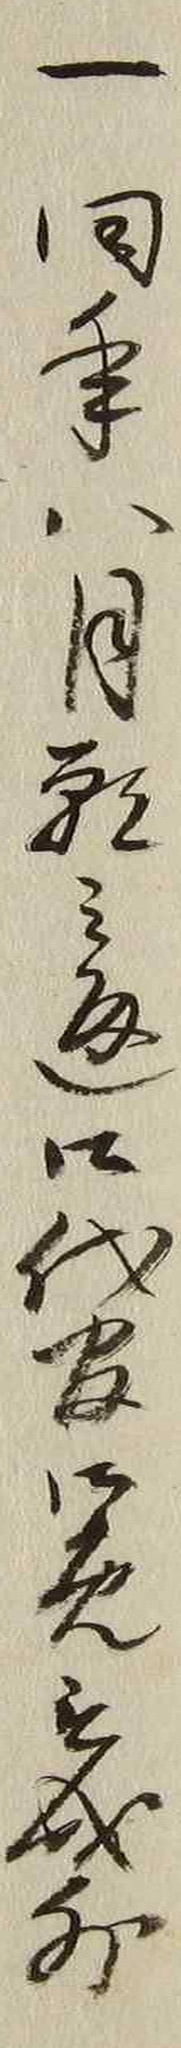一同年八月願之通御代官御免被成外
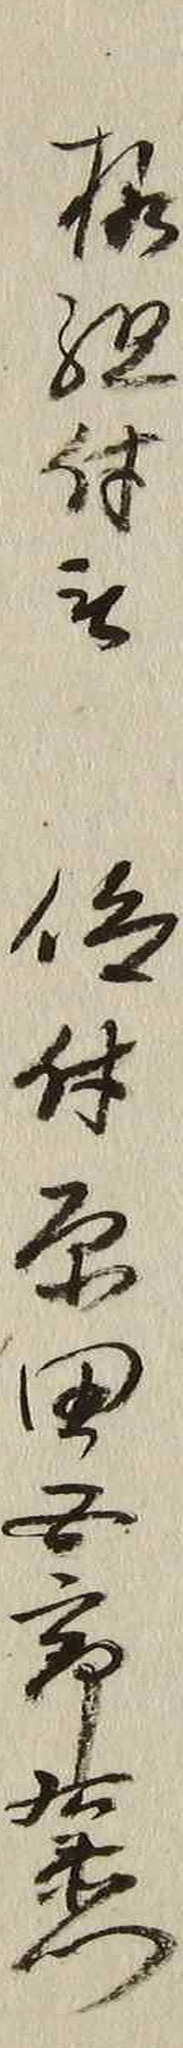様組付被仰付原田五郎右衛門
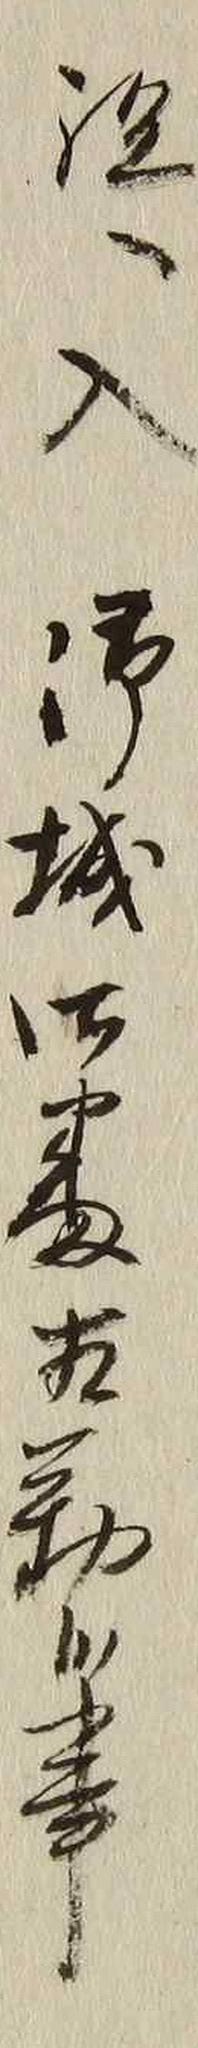組へ入御城御番相勤候事
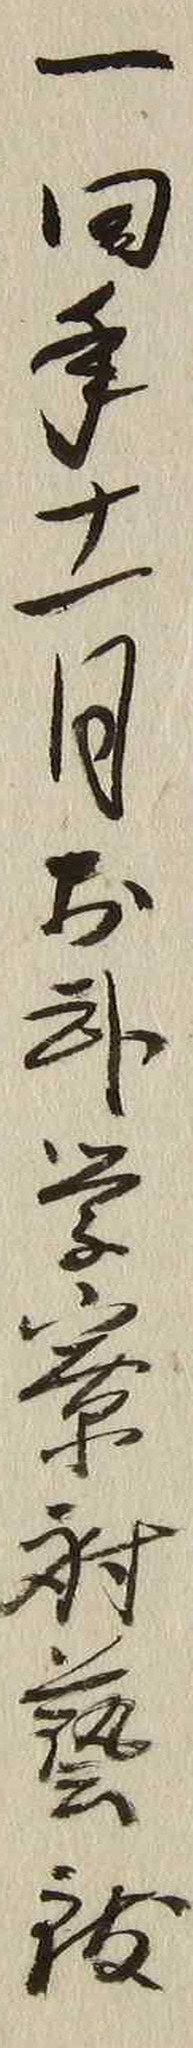一同年十一月於武学寮射芸致
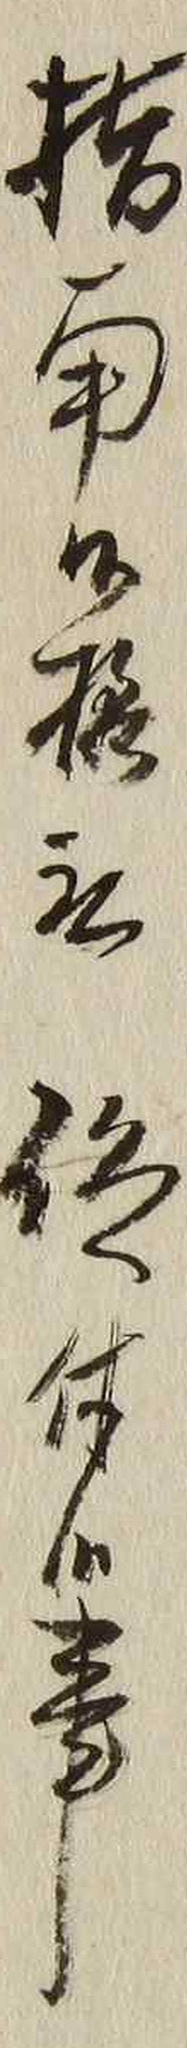指南候様被仰付候事
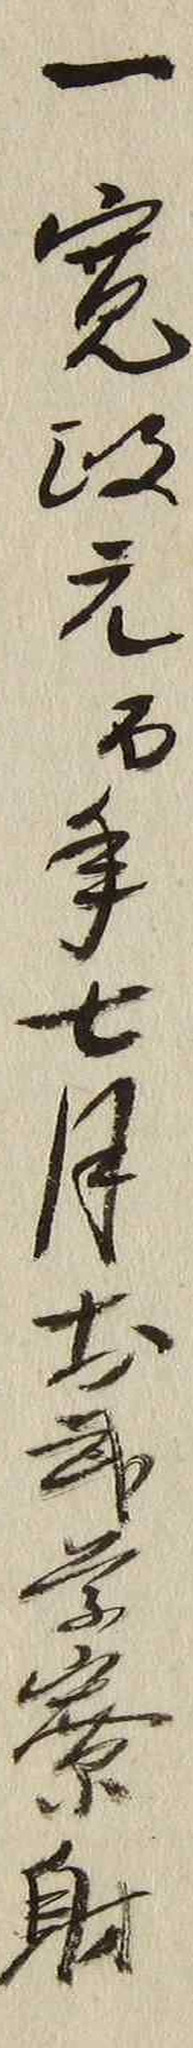一寛政元酉年七月於武学寮射
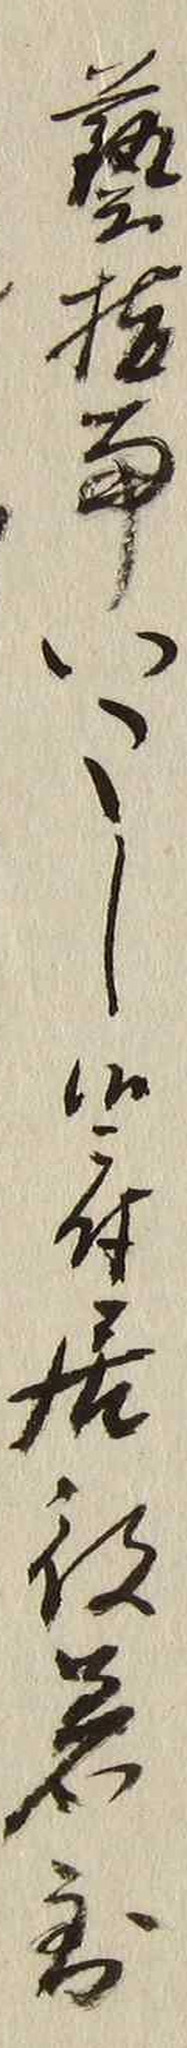芸指南いたし候ニ付居役着到
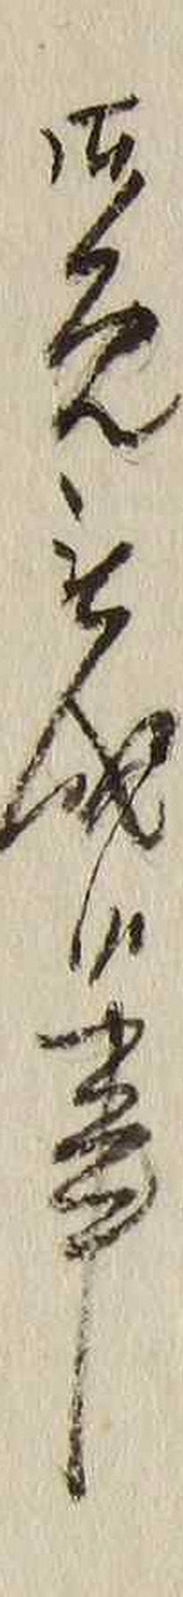御免被成候事
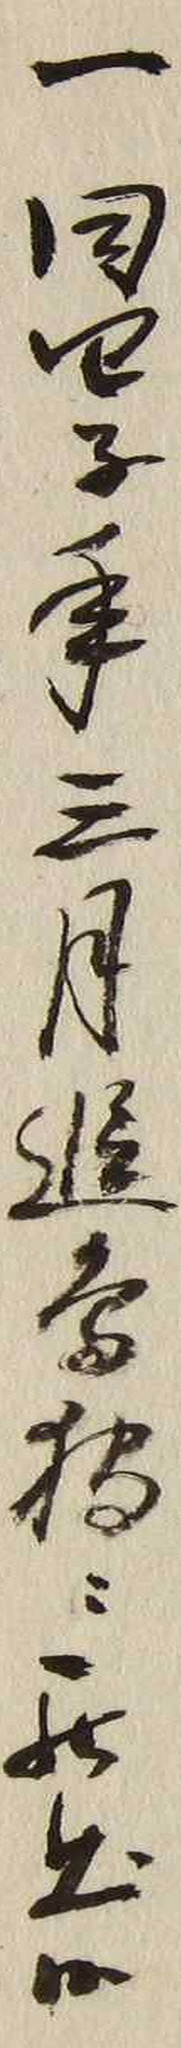一同四子年三月追鳥狩ニ罷出候
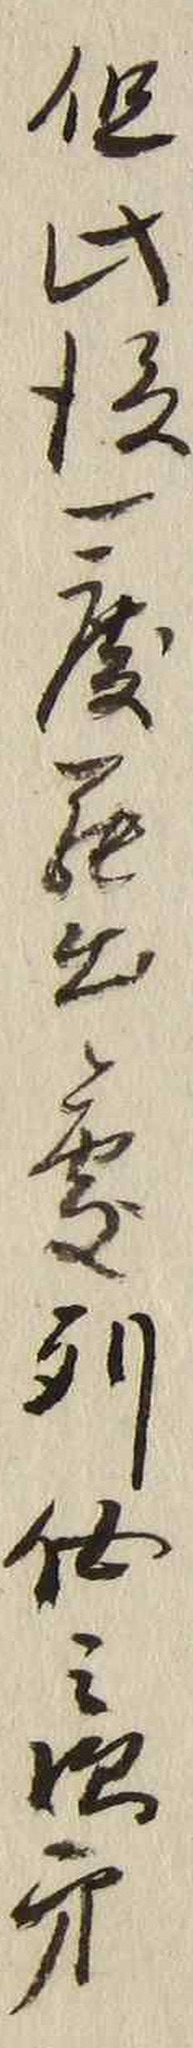但此後一度罷出候処列伍之次第

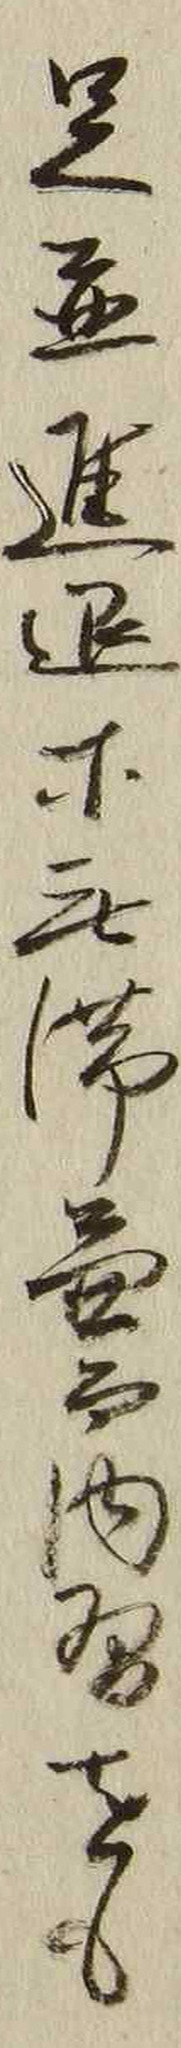足並進退等無滞兼而内習をも
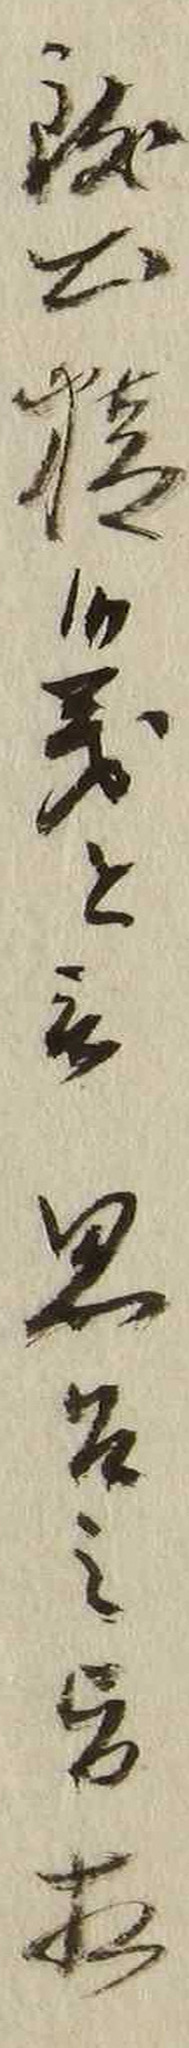致出精候義と被思召之旨相
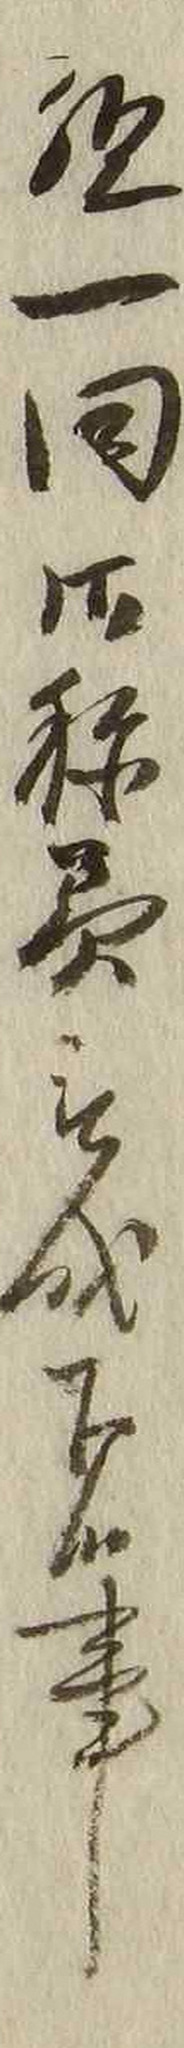組一同御称美被成下候事
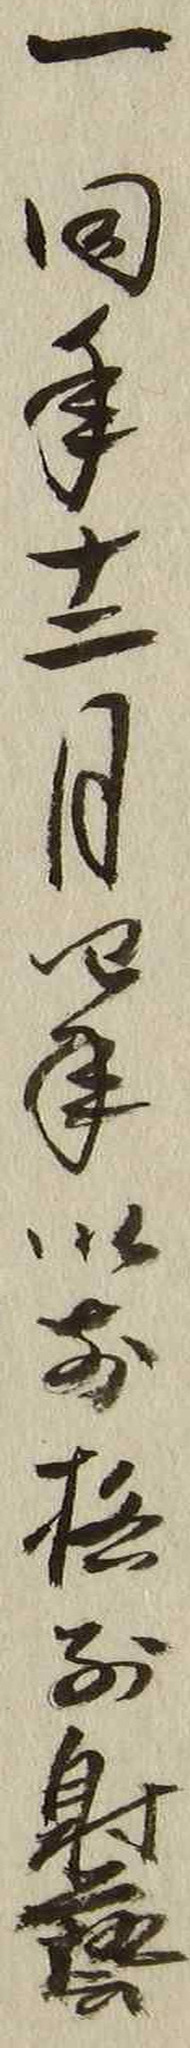一同年十二月四年以前格別射芸
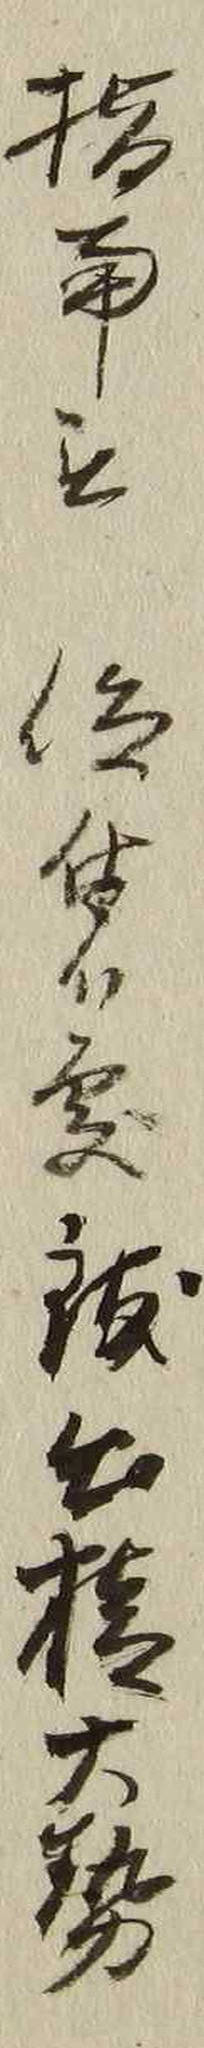指南被仰付候処致出精大勢
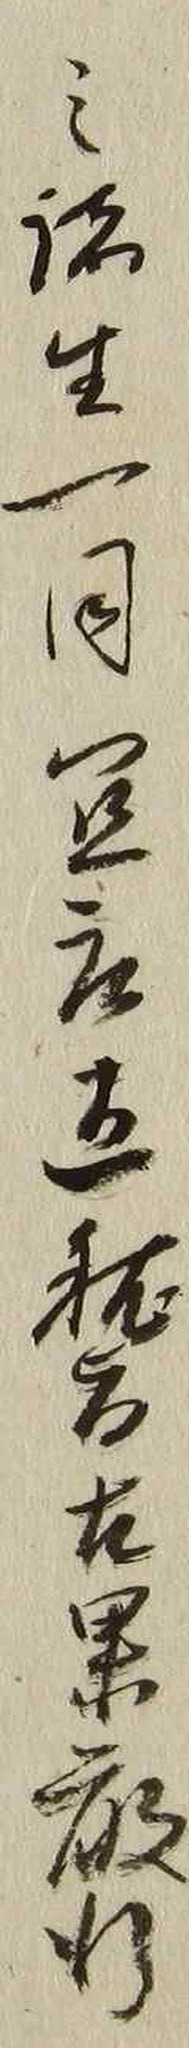之諸生一同宜取立稽古果敢行
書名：諸士系譜　巻之346　も之部2
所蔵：会津若松市立会津図書館
